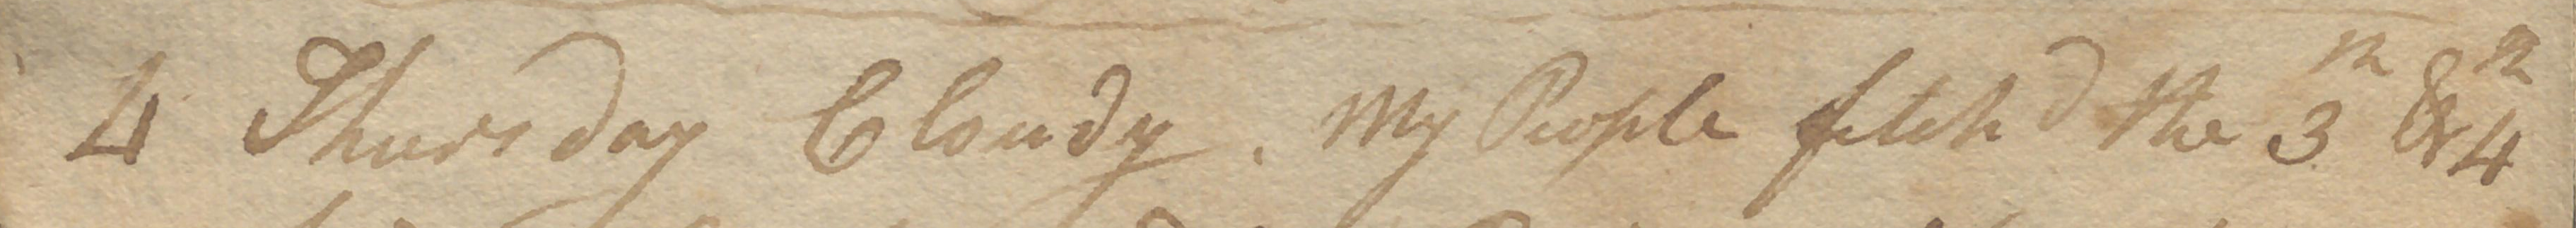4 Thursday Cloudy. My People fetch^d the 3^th & 4^th
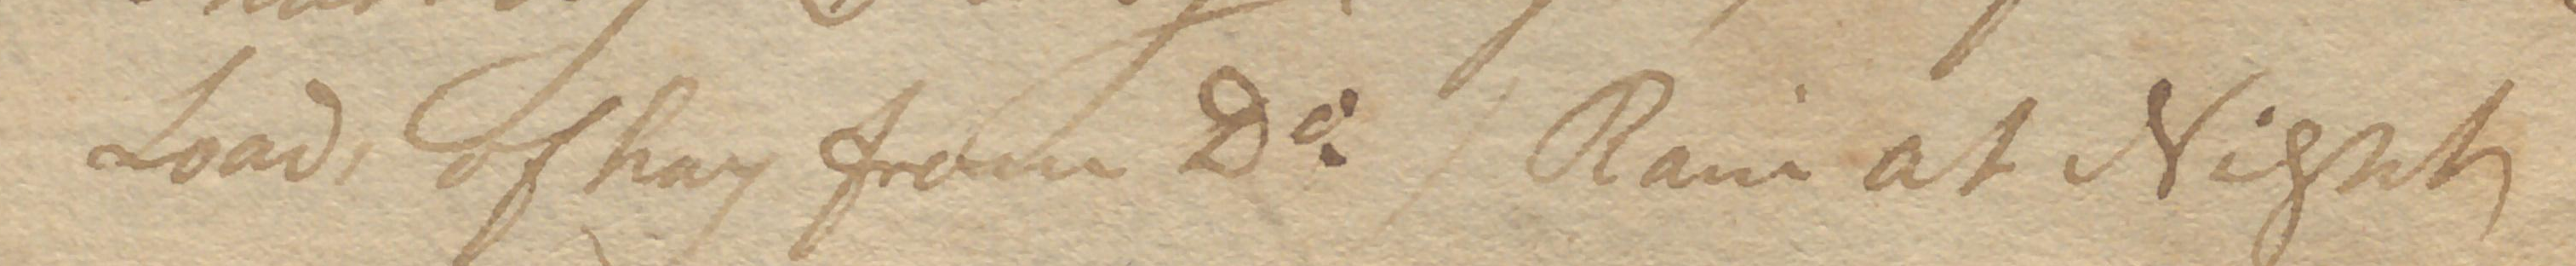Load of hay fro D^o. Rain at Night
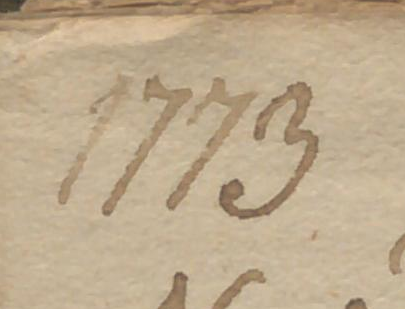1773
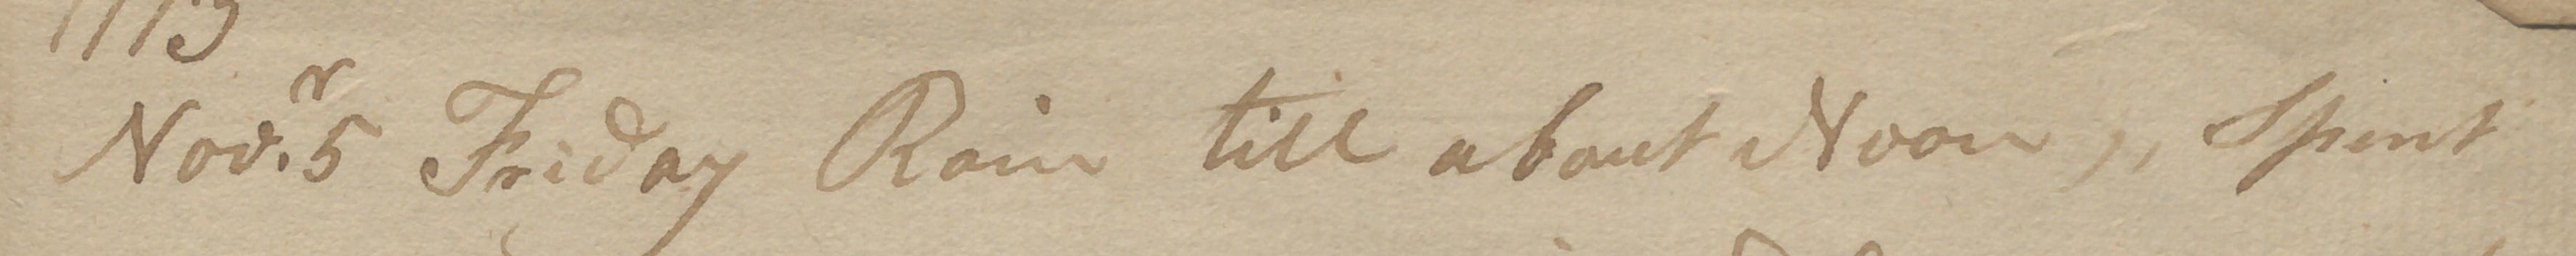Nov^r. 5 Friday Rain till about Noon spent
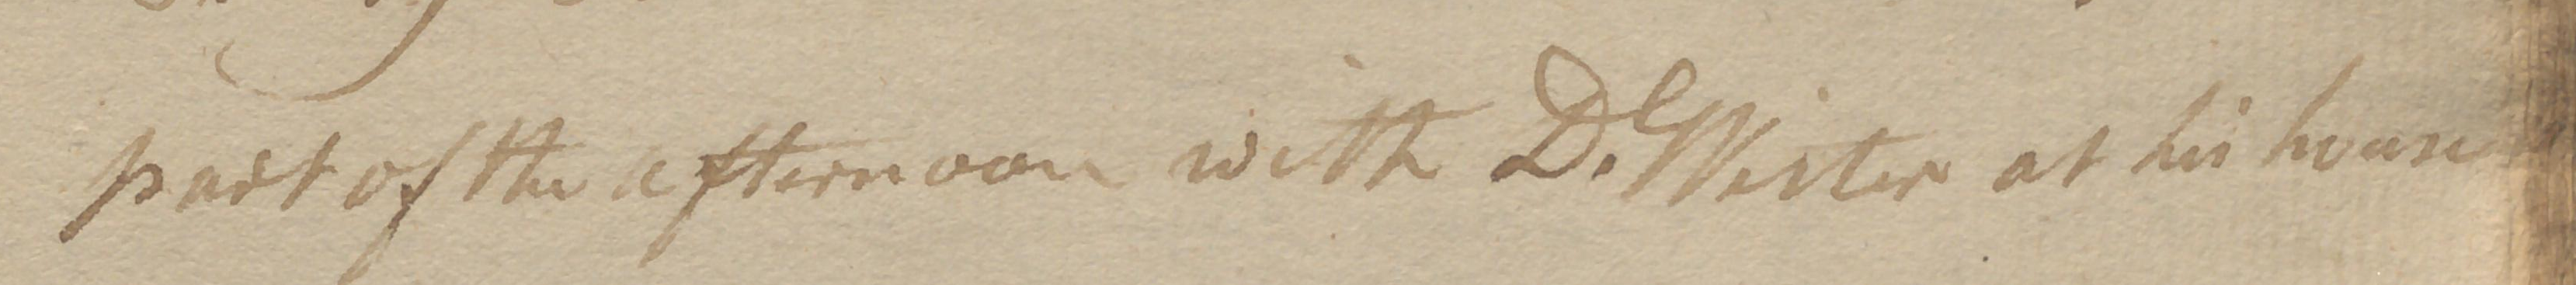part of the afternoon with D^l. Wister at his house
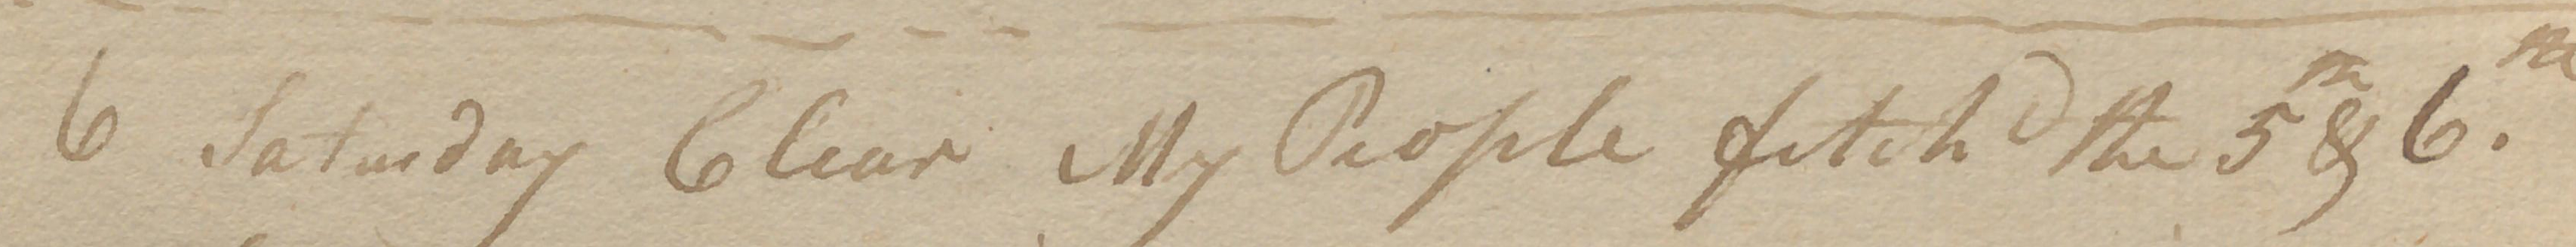6 Saturday Clear My People fetch^d the 5^th & 6^th.
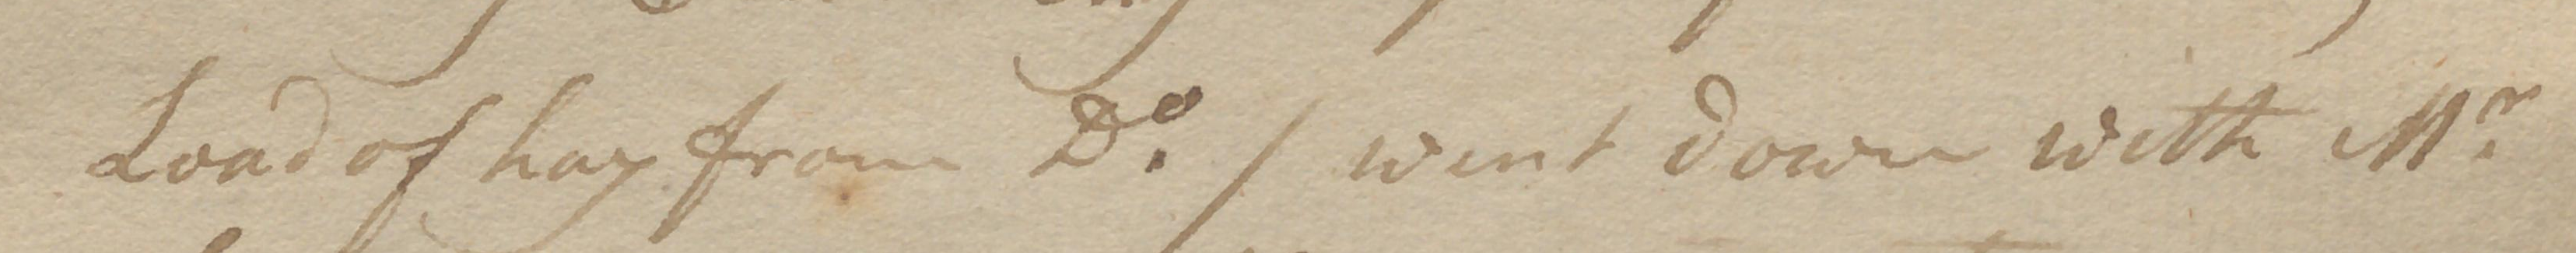Load of hay from D^o.) went down with M^r.
